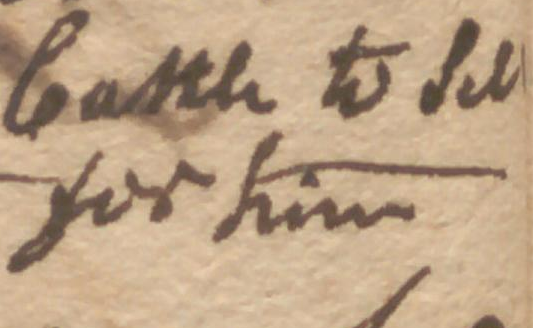for him
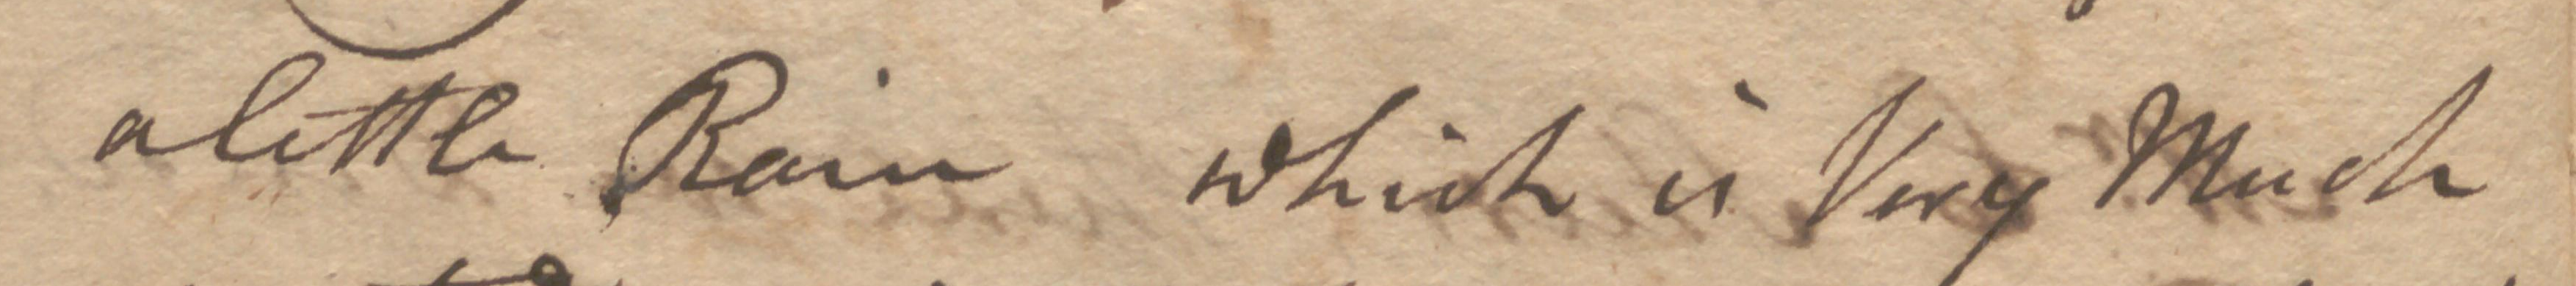a little Rain which is Very Much
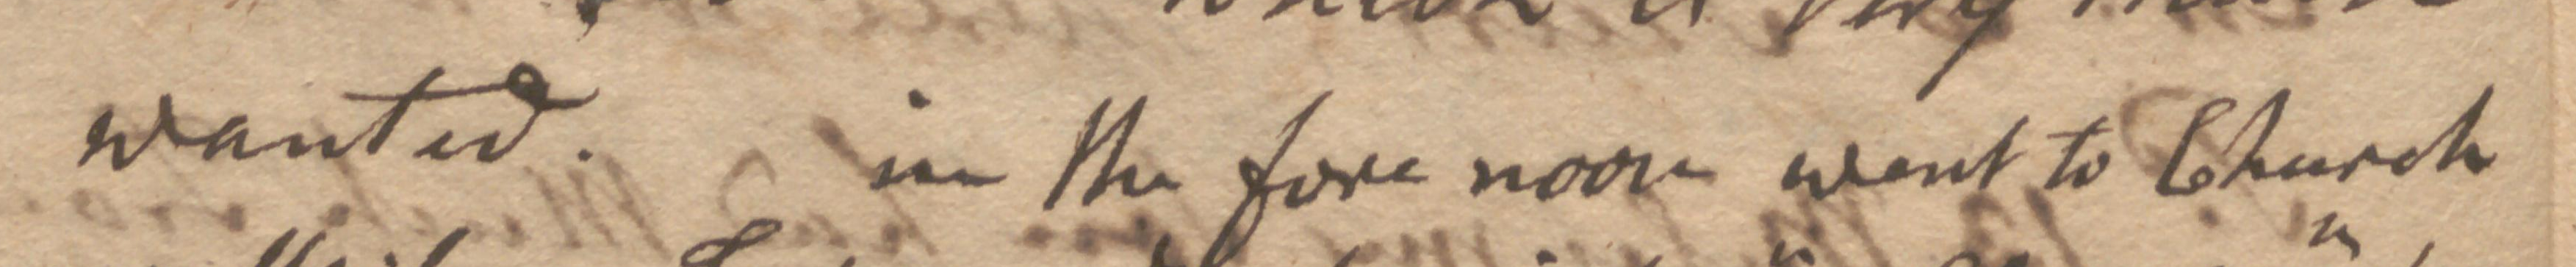wanted. in the fore noon went to Church
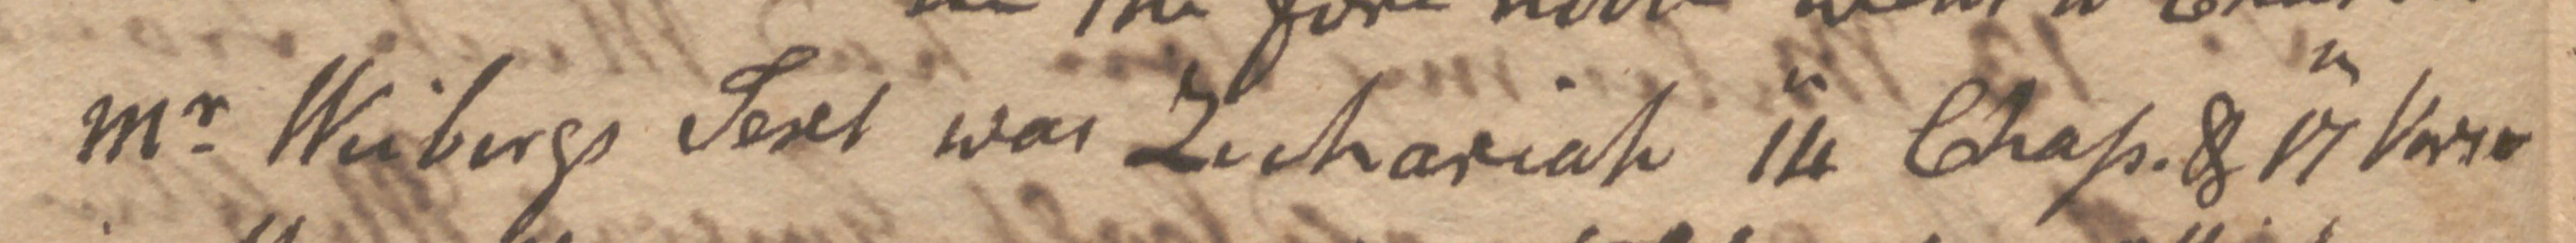M^r. Weibergs Text was Zechariah 14 Chap. & 17^th Verse
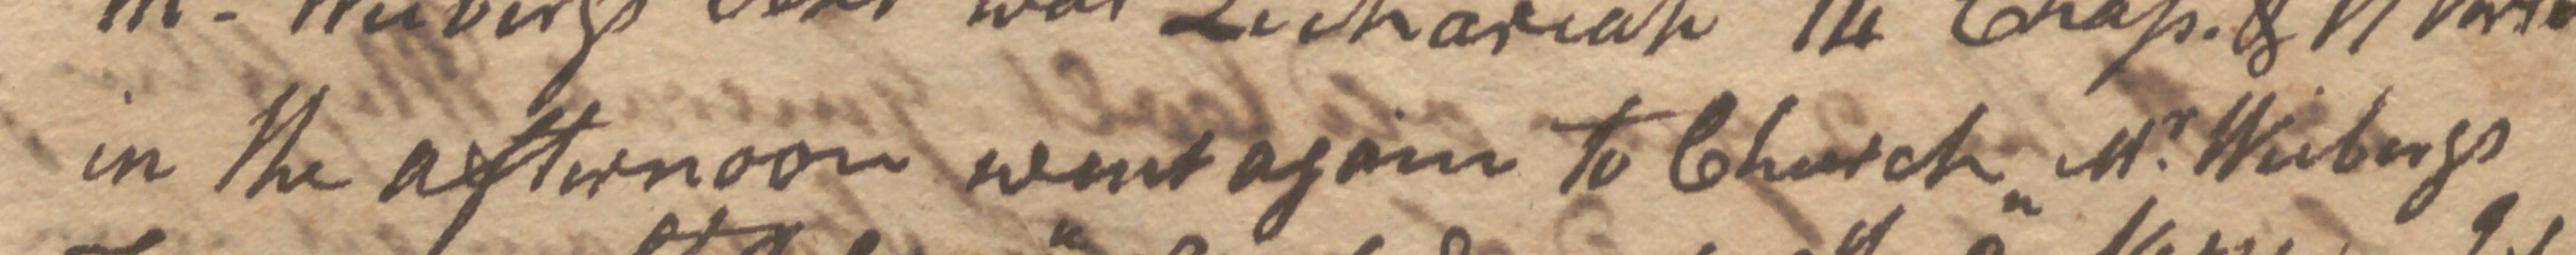in the afternoon went again to Church, M^r. Weibergs
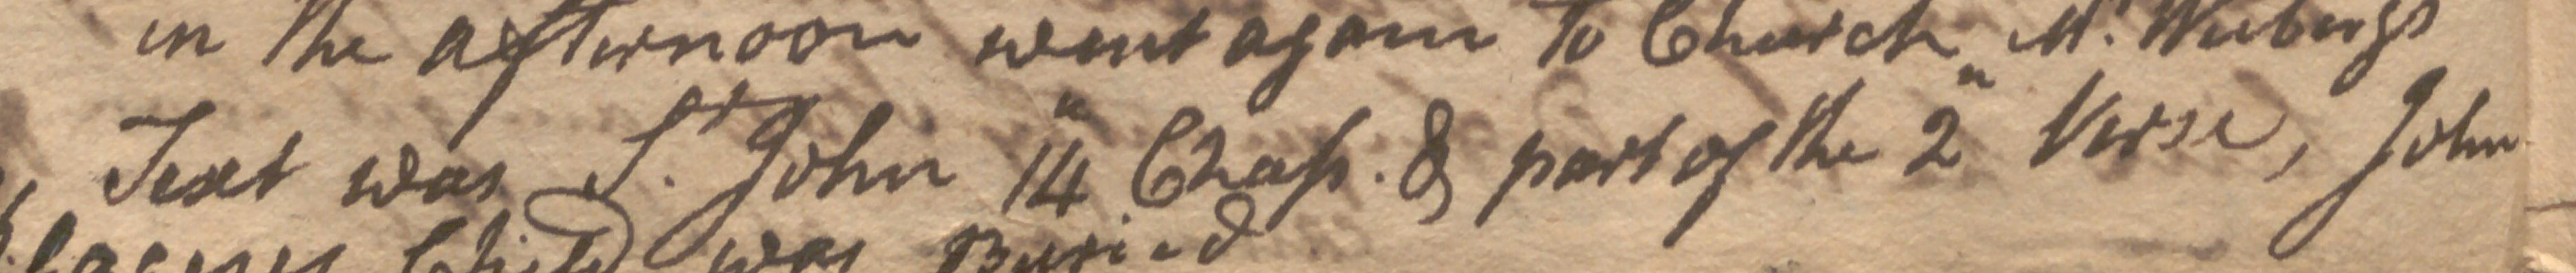Text was S^t. John 14 Chap. & part of the 2 Verse, John
